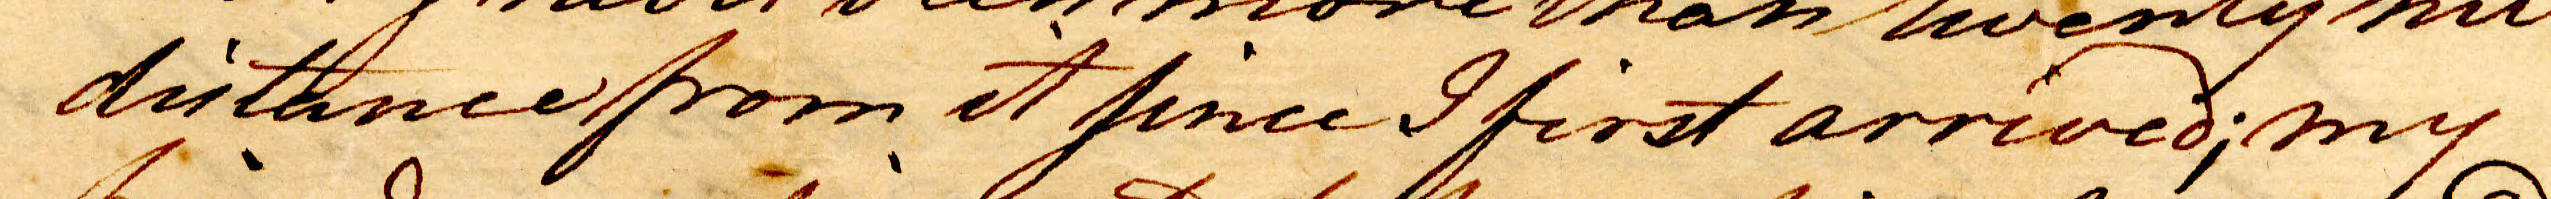distance from it since I first arrived; my
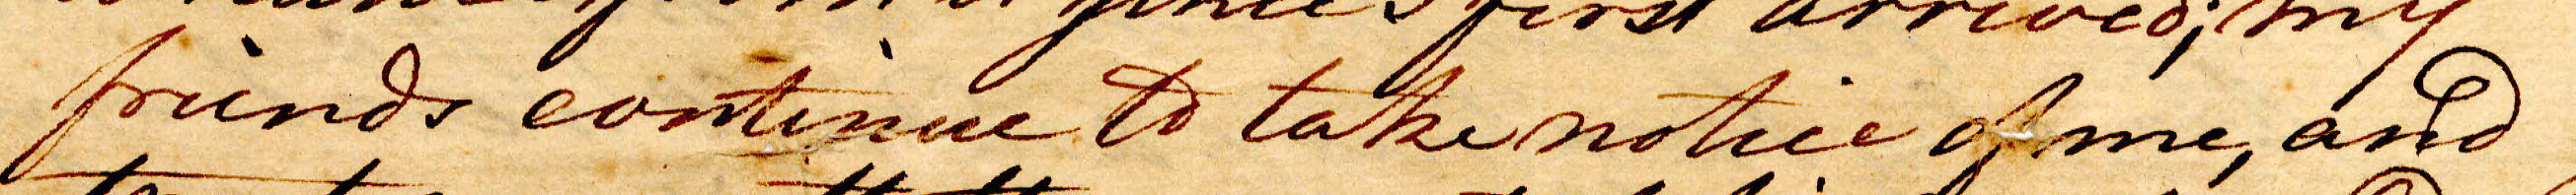friends continue to take notice of me, and
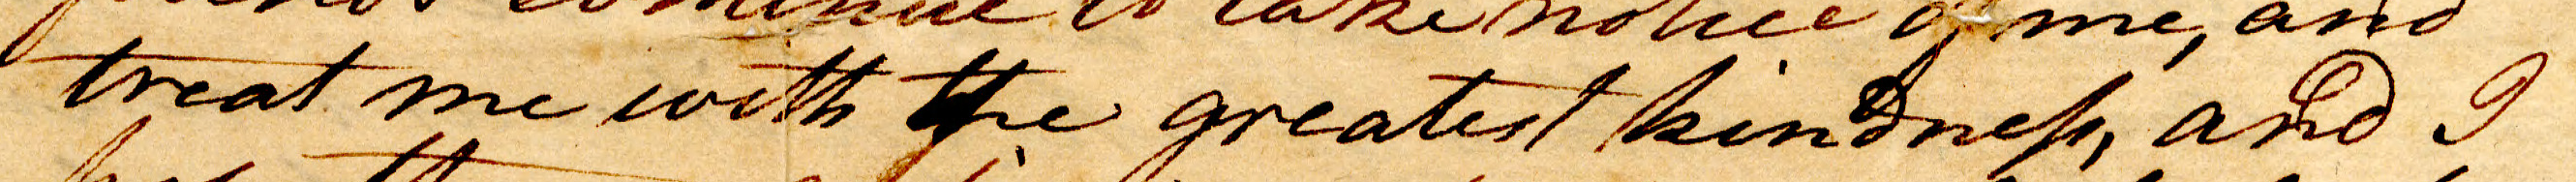treat me with the greatest kindness, and I
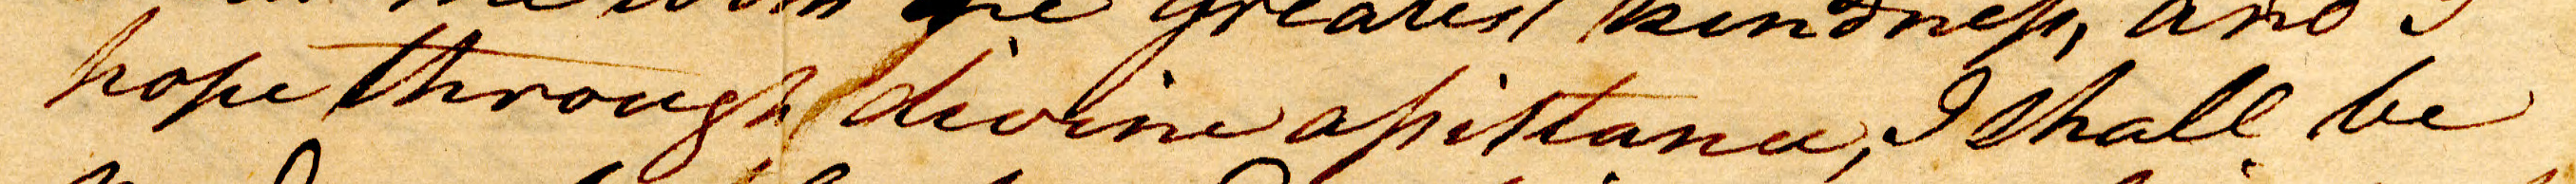hope through divine assistance, I shall be
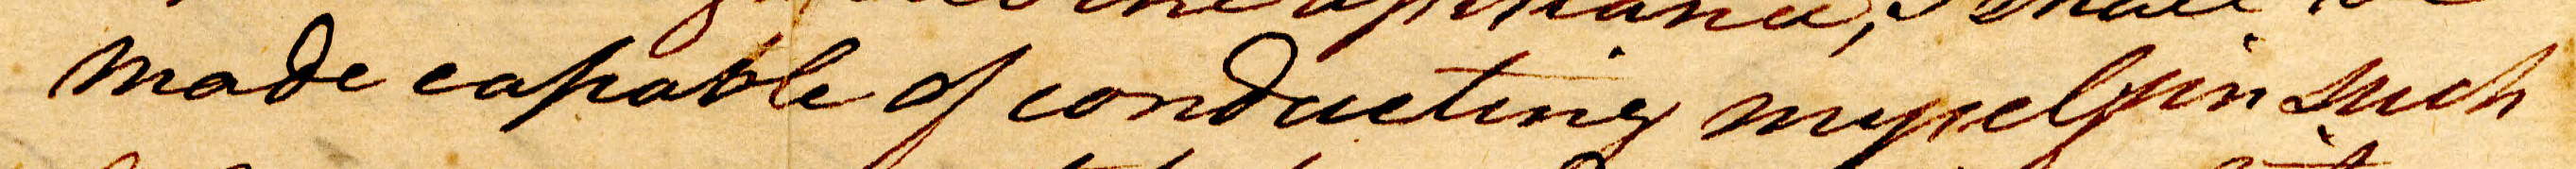made capable of conducting myself in such
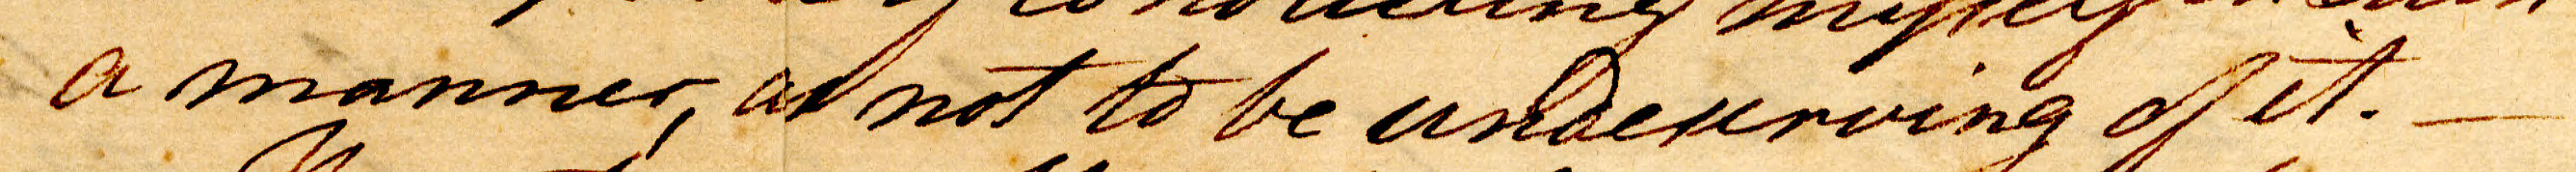a manner as not to be undeserving of it.-
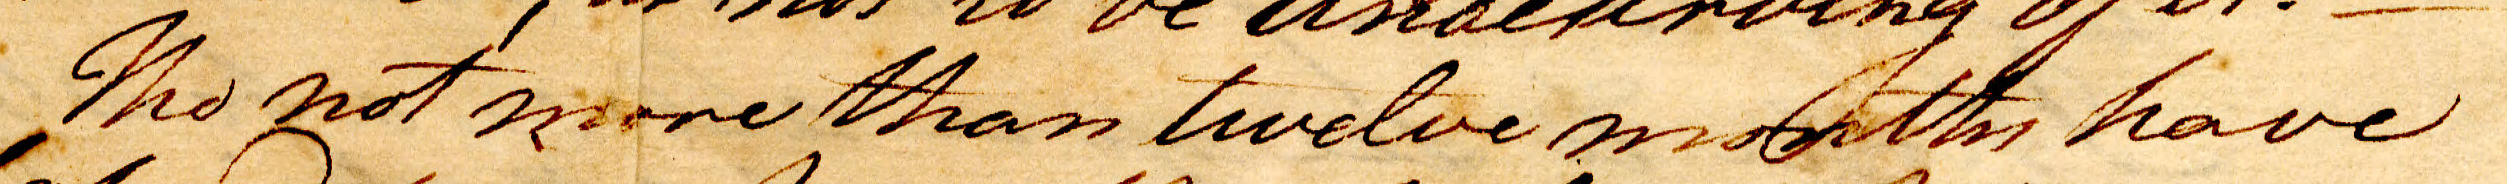Tho not more than twelve months have
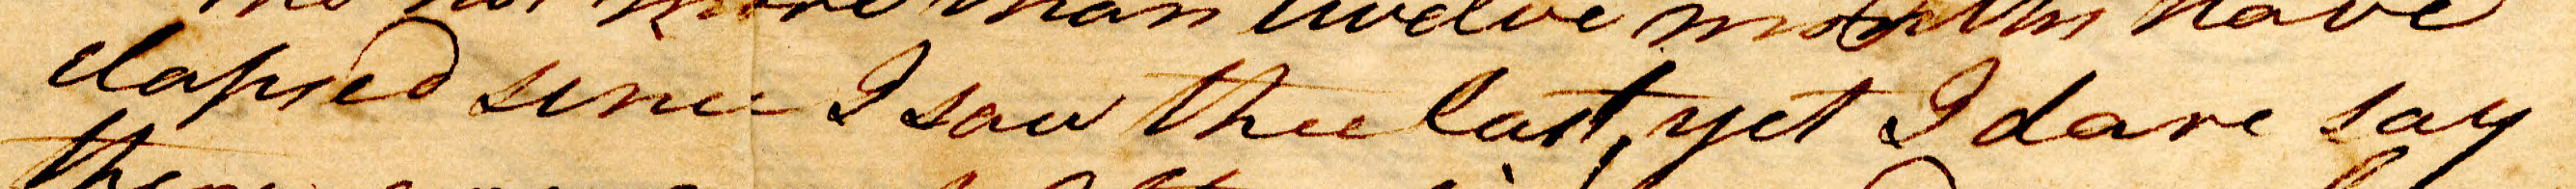elapsed since I saw thee last, yet I dare say
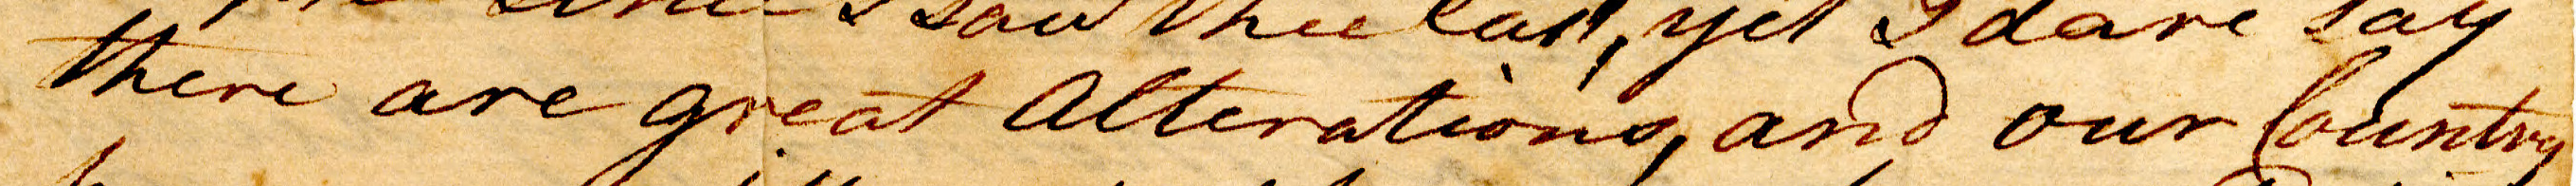there are great Alterations, and our Country
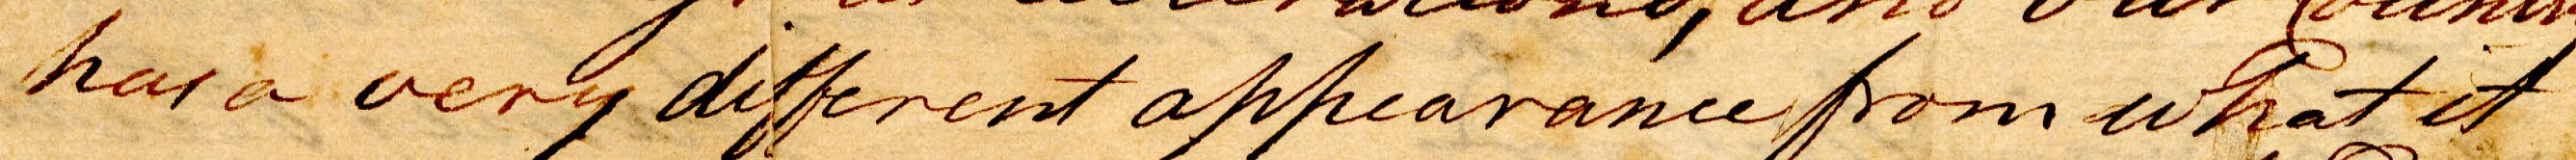has a very different appearance from what it
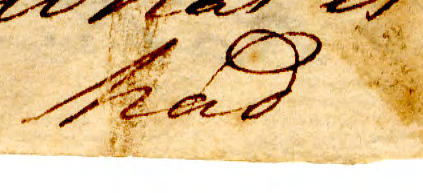had
